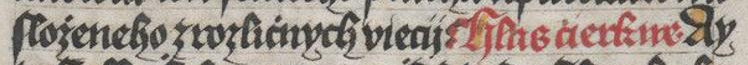ſlożeneho z rozliċnych viecij?Hlas cierkwe.Ay
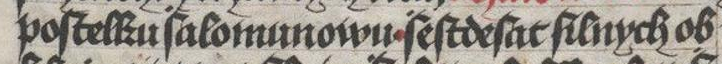poſtelku ẛalomunowu.ẛeſtdeſat ſilnych ob¬
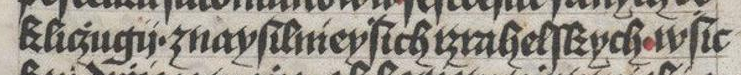klicżugij.znayſilníeyẛích izrahelſkych.wẛic
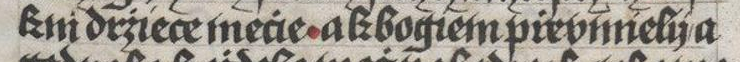kni drżiece meċie.akbogiem pṙevmielij a
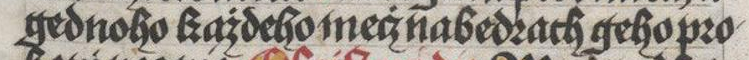gednoho każdeho mecż nabedrach geho pro¬
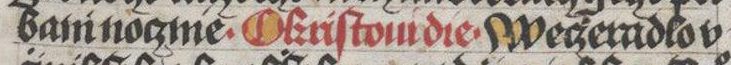bani noczníe.Okriſtoui die.Wecżeradlo v¬
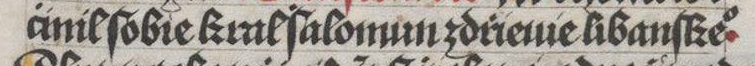ċinil ſobie kral ẛalomun zdṙíeuie libanſke°
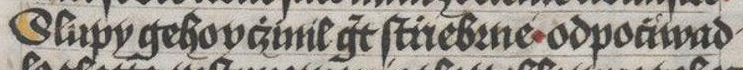Slupy geho vcżinil ḡt ſtṙuebrné.odpoċiwad¬
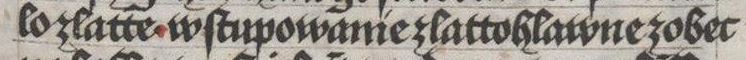lo zlatte.wſtupowaníe zlattohlawne zobec¬
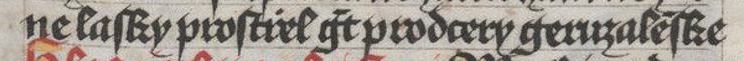ne laſky proſtṙel ḡt prodcery geruzalēẛke
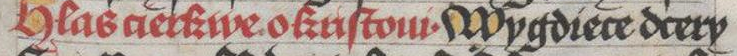Hlas cierkwe o kriſtoui.Wygdiéce dcery
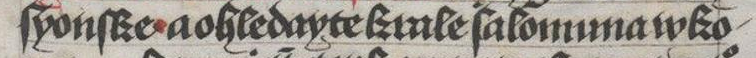ſyonſke.a ohledayte krale ẛalomuna wko¬
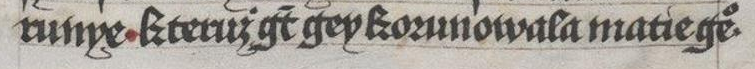runye.kteruż ḡt gey korunowala matie ge°
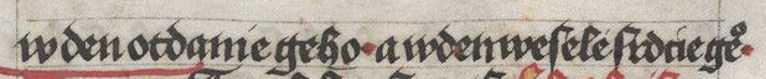w den otdaníe geho.a w den weſelé ſrdcie ge°.
